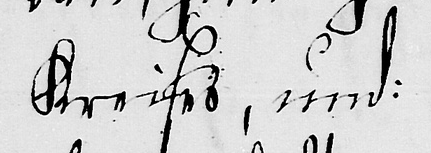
Kreises, und:
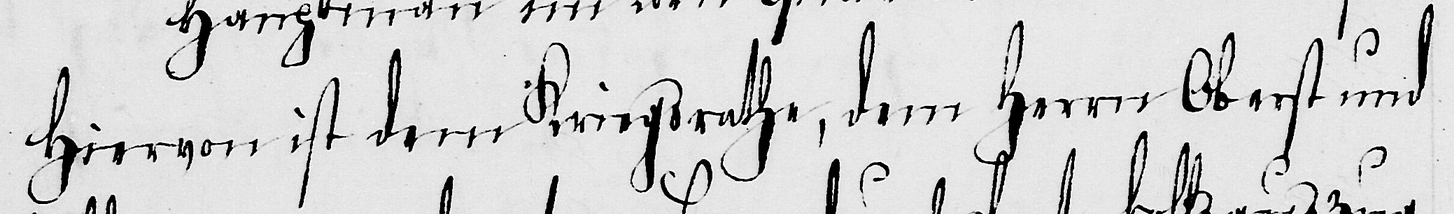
Hiervon ist dem Kriegsrathe, dem Herrn Oberst und
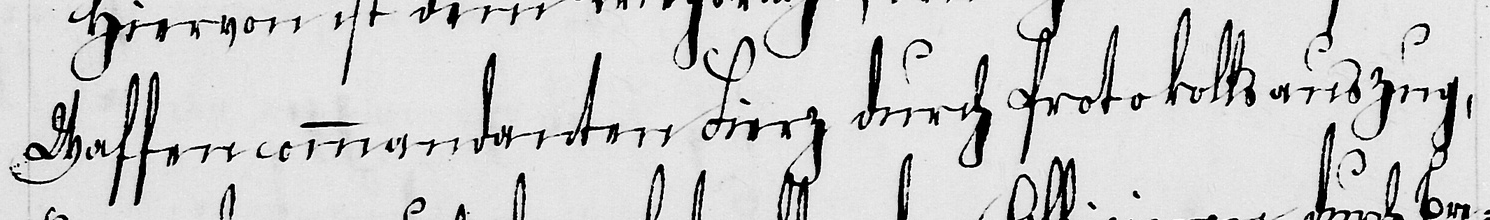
Waffencommandanten Fierz durch Protokollsauszug,
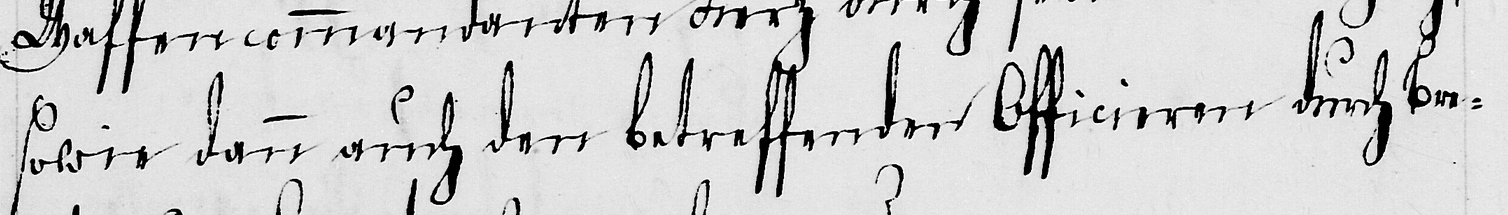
sowie dann auch den betreffenden Officieren durch Bre¬
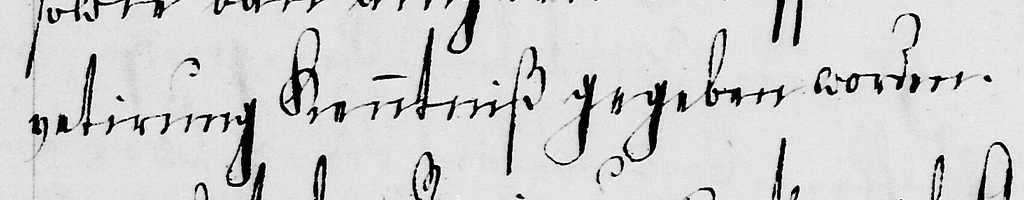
vetirung Kenntniß gegeben worden.
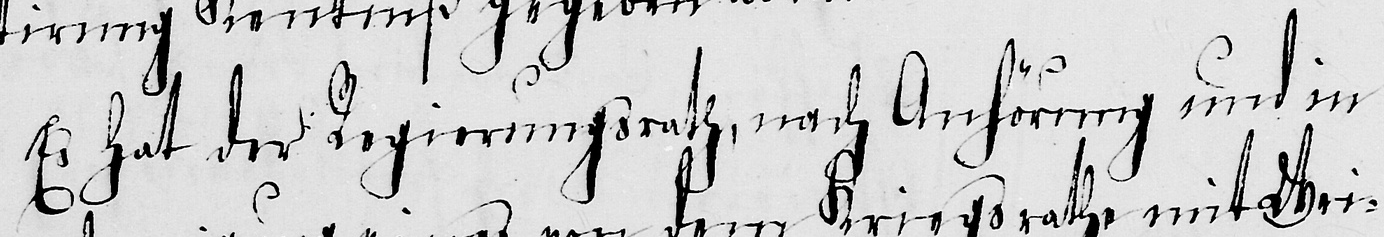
Es hat der Regierungsrath, nach Anhörung und in
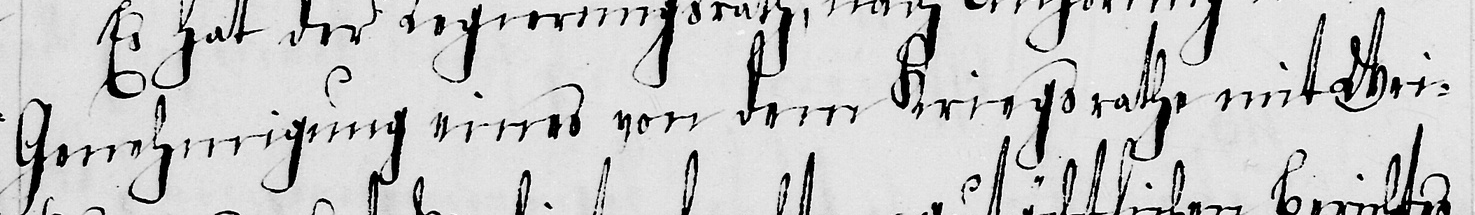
Genehmigung eines von dem Kriegsrathe mit Wei¬
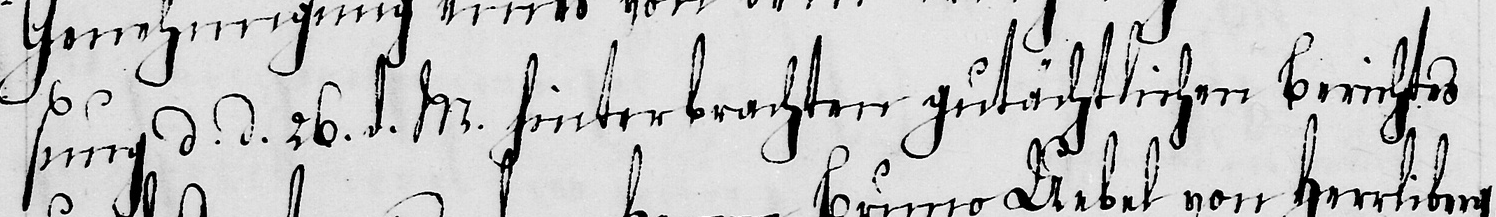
sung d.d. 26. d. M. hinterbrachten gutächtlichen Berichtes
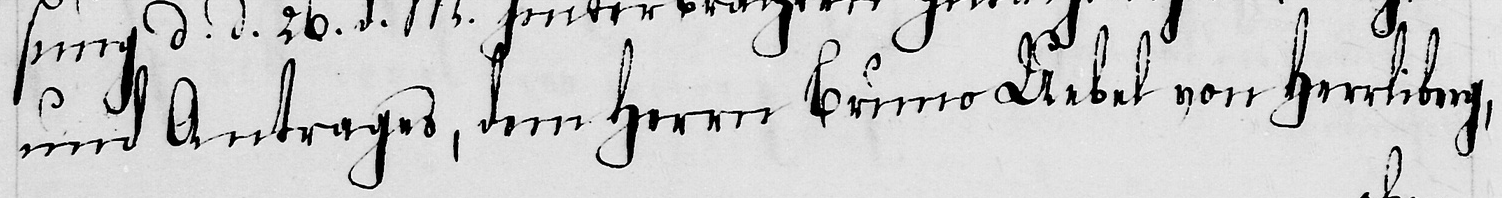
und Antrages, dem Herrn Bruno Uebel von Herrliber¬
